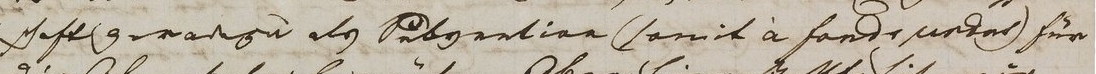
schaft geradezu als Subvention (somit à fonds perdus) für
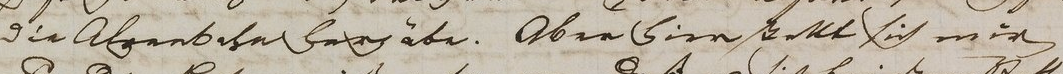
die Alpenbahn hergäbe. Aber hier stellt sich mir
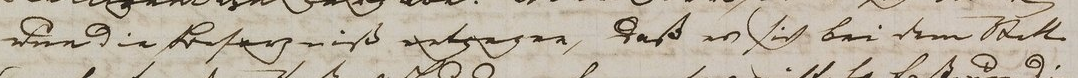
nun die Besorgniß entgegen, daß es sich bei dem Stell-
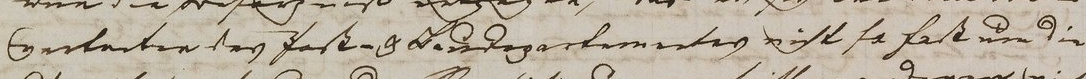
vertreter des Post- & Baudepartementes nicht so fest um die
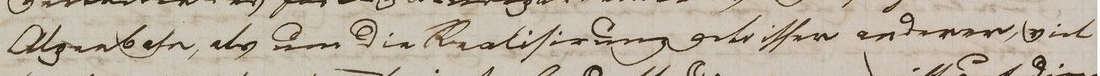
Alpenbahn, als um die Realisirung gewisser anderer, viel
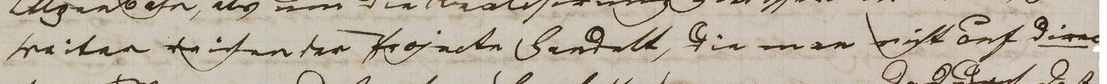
weiter reichender Projecte handelt, die man nicht auf direc-
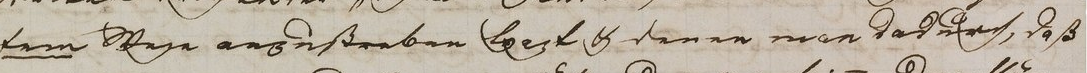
tem Wege anzustreben wagt & denen man dadurch, daß
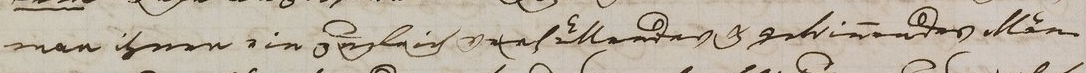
man ihnen ein zugleich verhüllendes & gewinnendes Män-
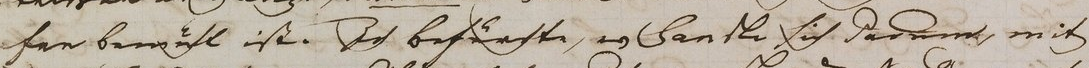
fen bemüht ist. Ich befürchte, es handle sich darum, mit
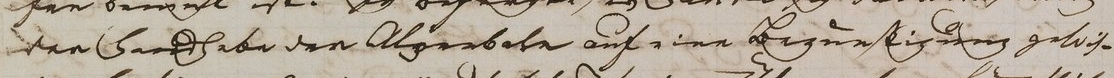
der Handhabe der Alpenbahn auf eine Begünstigung gewis-
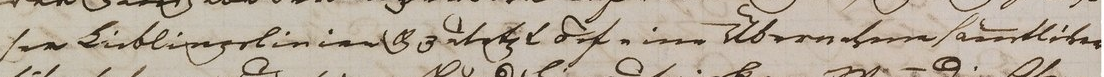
ser Lieblingslinien & zuletzt auf eine Übernahme sämmtlicher
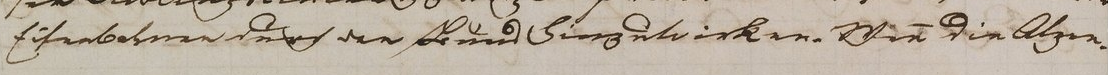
Eisenbahnen durch den Bund hinzuwirken. Wenn die Alpen -
